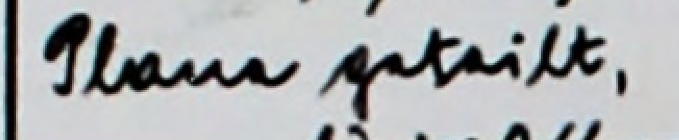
Plane geteilt,
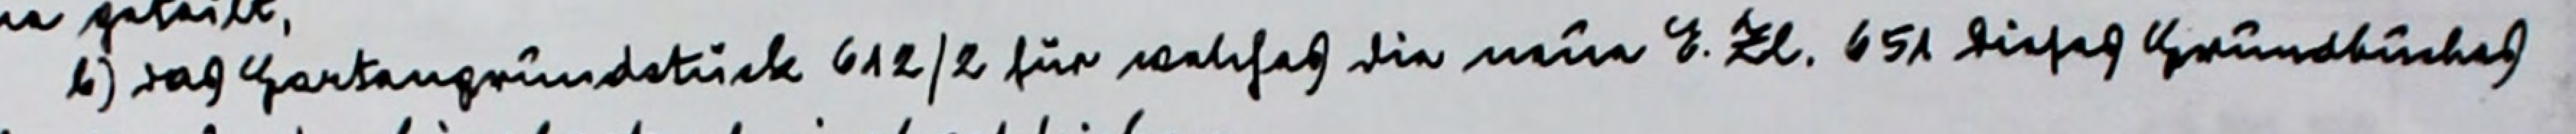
b) das Gartengrundstück 612/2 für welches die neue E. Zl. 651 dieses Grundbuches
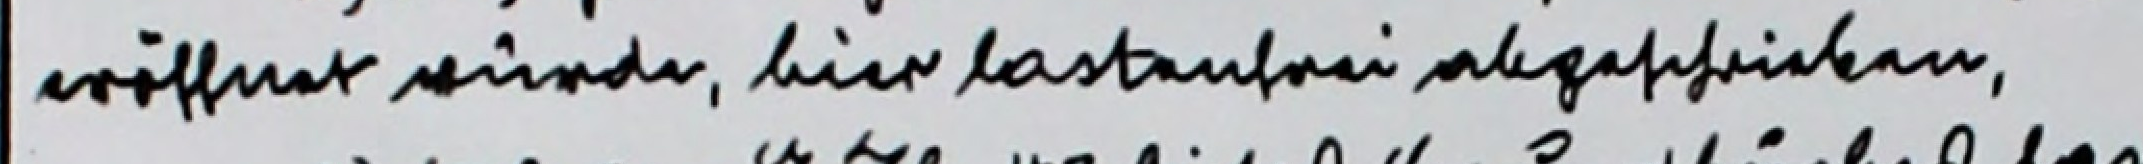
eröffnet würde, hier lastenfrei abgeschrieben,
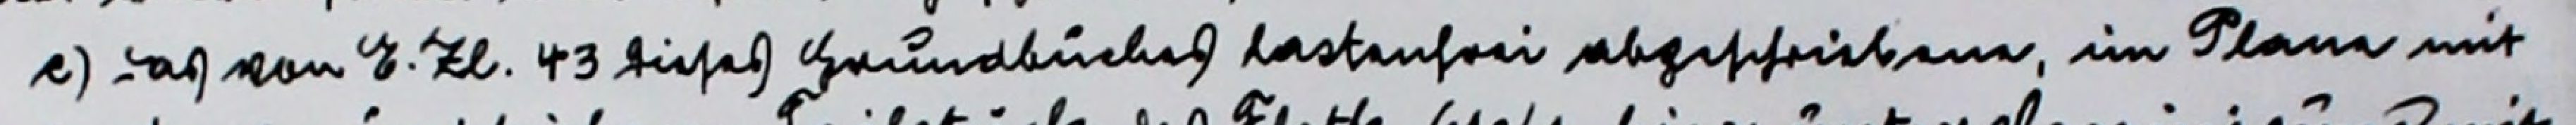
c) das von E. Zl. 43 dieses Grundbuches lastenfrei abgeschriebene, im Plane mit
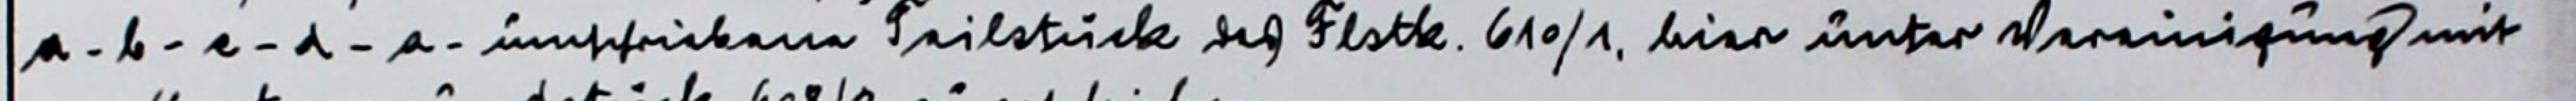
a - b - c- d - a- umschriebene Teilstück des Flstk. 610/1, hier unter Vereinigung mit
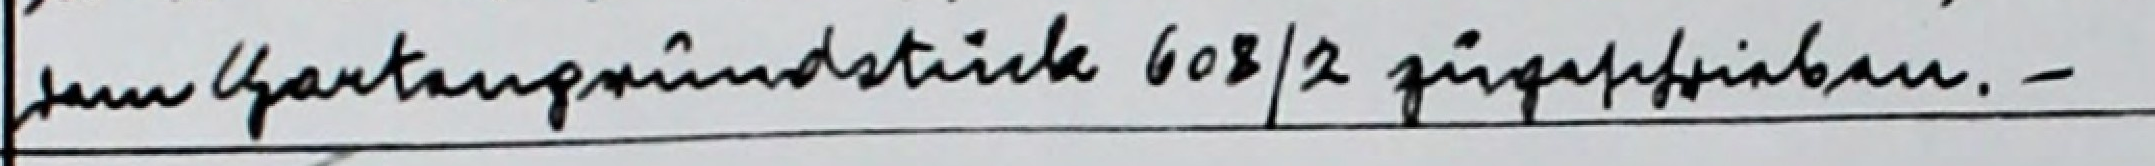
dem Gartengrundstück 608/2 zugsschrieben.-
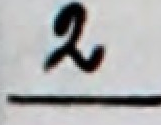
2
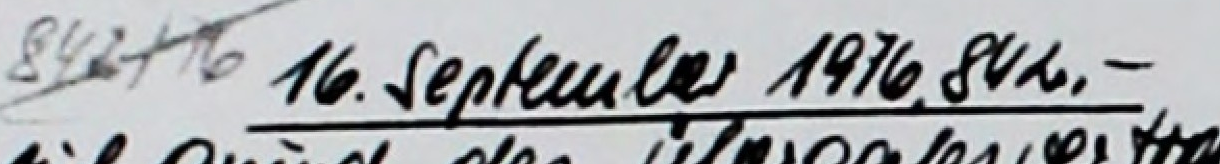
842/76 16. September 1976, 842.-
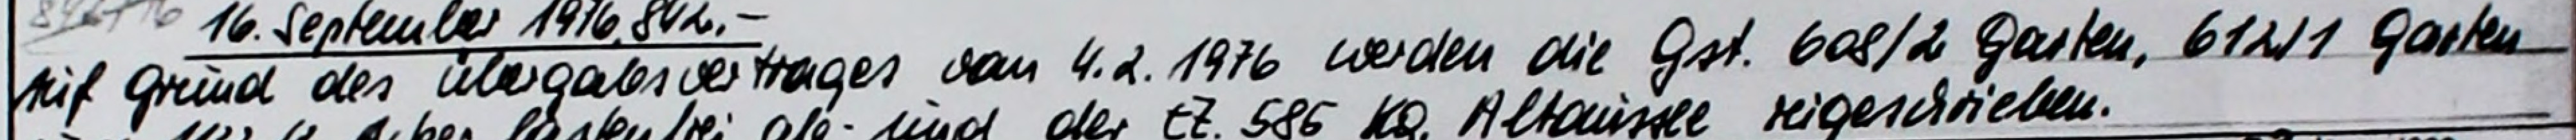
Auf Gund des übergabsvertrages von 4.2.1976 werden die Gst. 608/2 Garten, 612/1 Garten
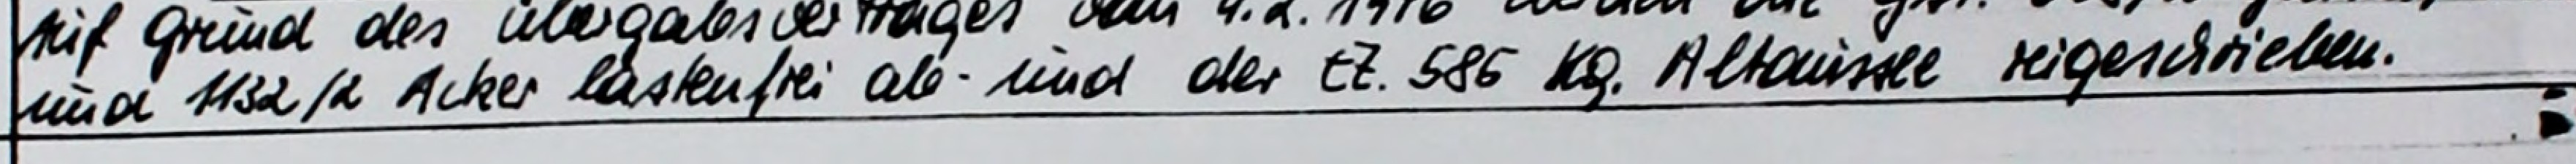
und 1132/2 Acker lastenfrei ab - und der EZ. 586 KG. Altaussee zugeschrieben.
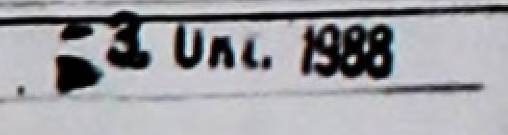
3 Okt. 1988
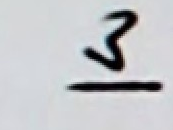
3
